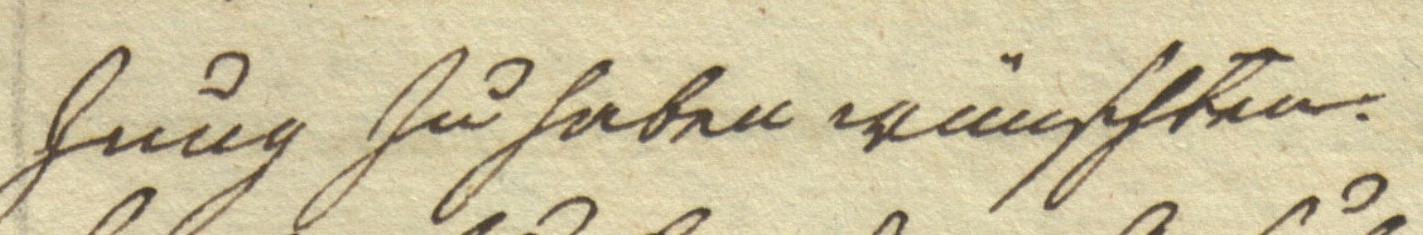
zung zu haben wünschten
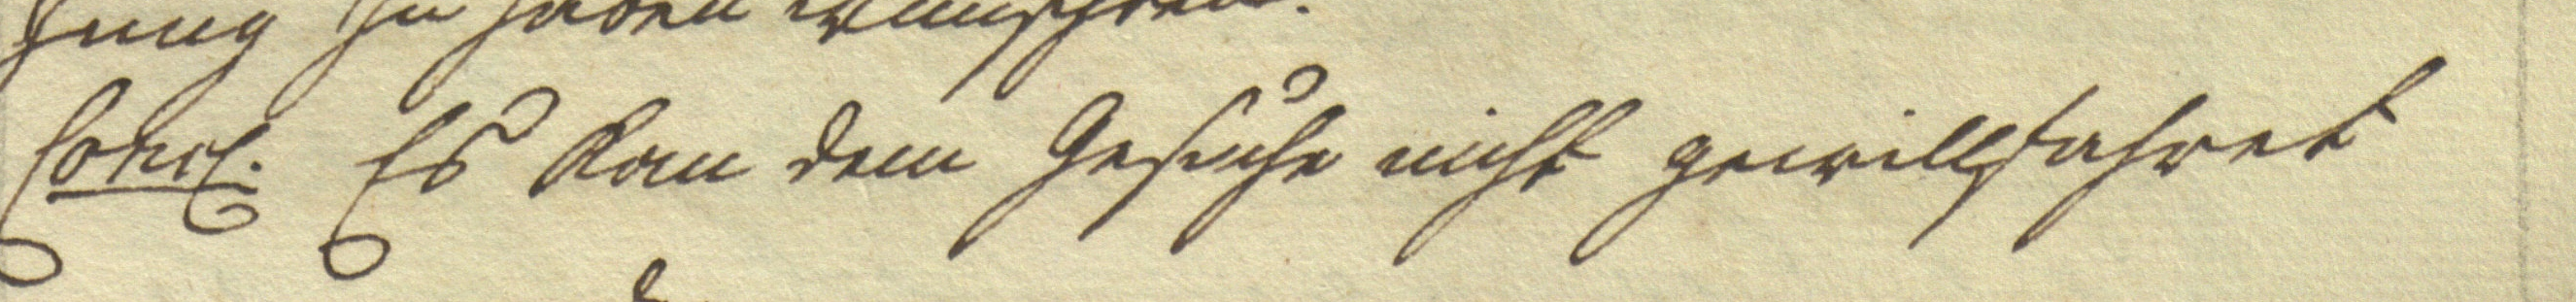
Concl. Es kan dem Gesuche nicht gewillfahret
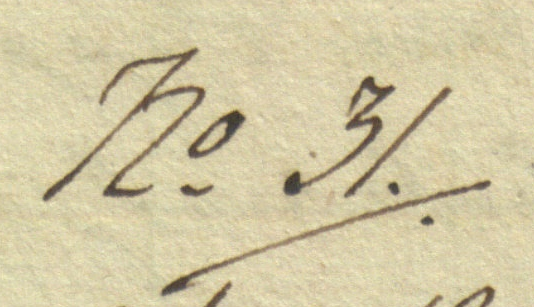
No 31.
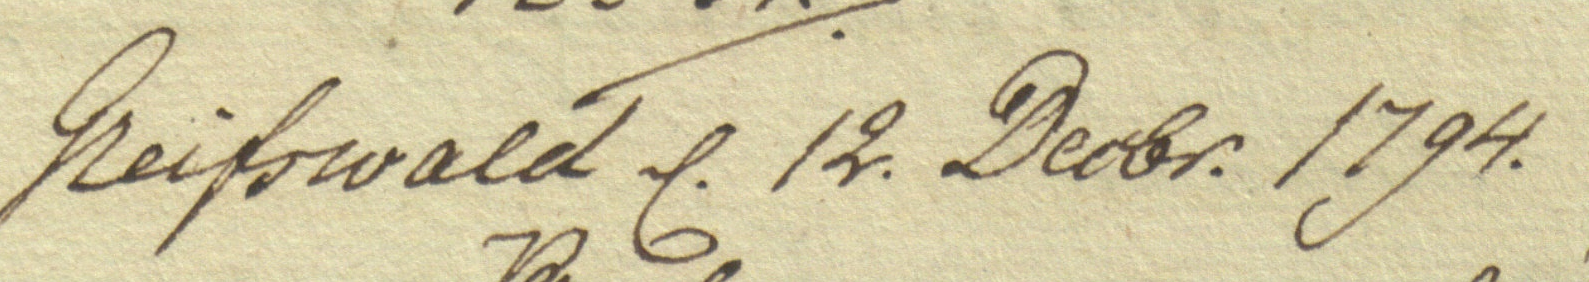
Greifswald d. 12. Decbr. 1794.
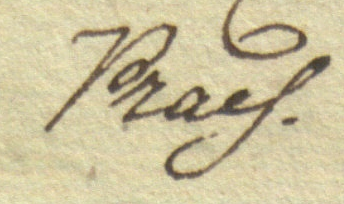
Praes.
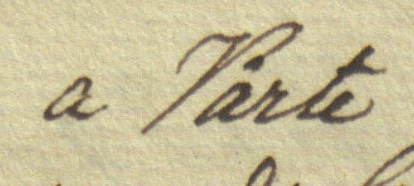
a Parte
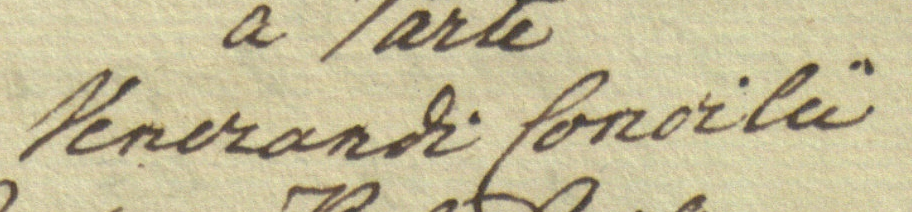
Venerandi Concilii
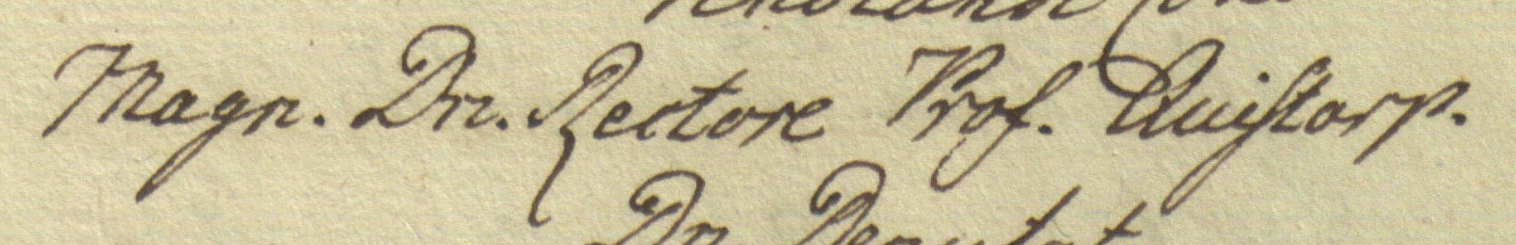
Magn. Dn. Rectore Prof. Quistorp.
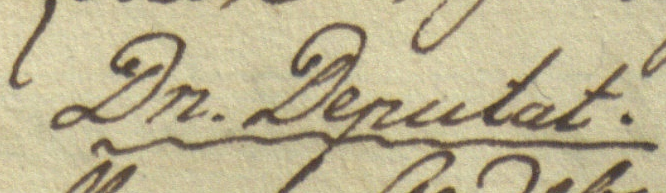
Dn. Deputat.
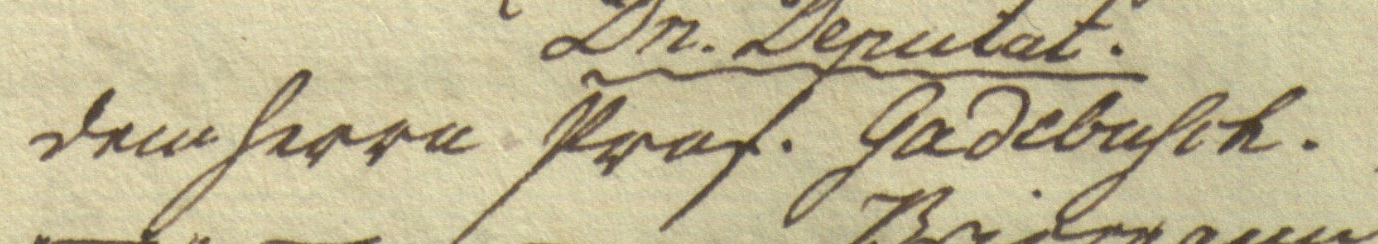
dem Herrn Prof. Gadebusch.
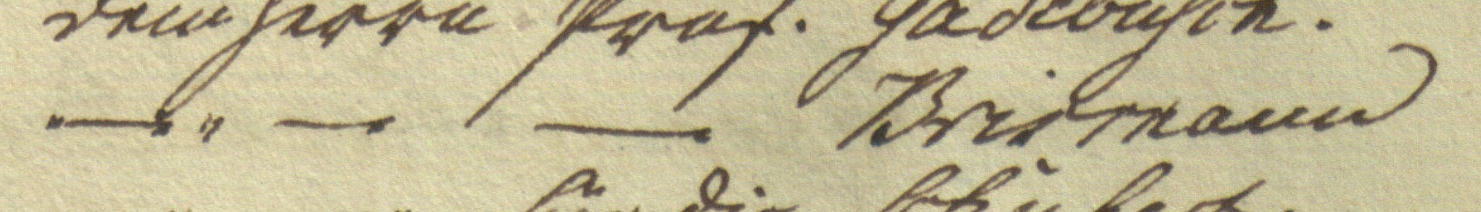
Brismann
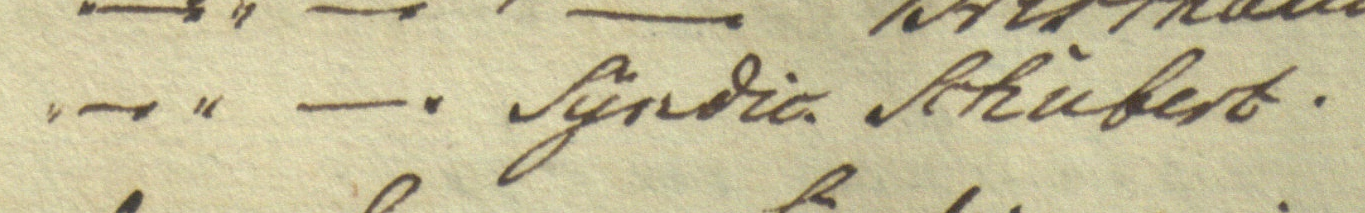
Sÿndic. Schubert.
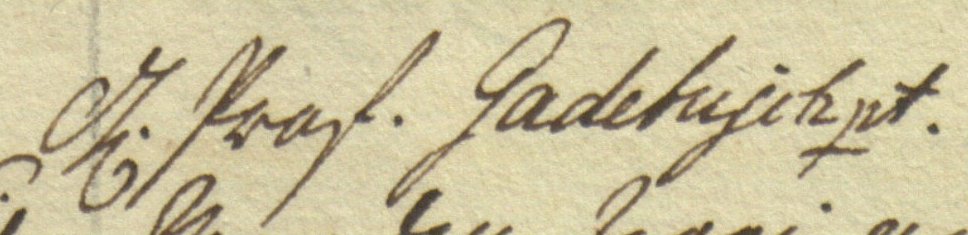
dh. Prof. Gadebusch pt.
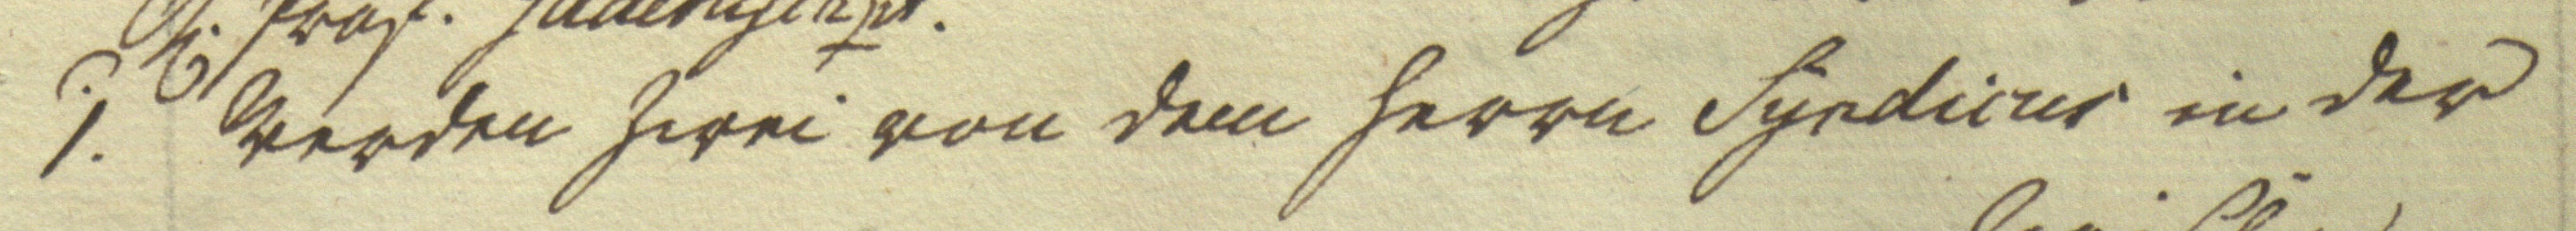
1. Werden zwei von dem Herrn Sÿndicus in der
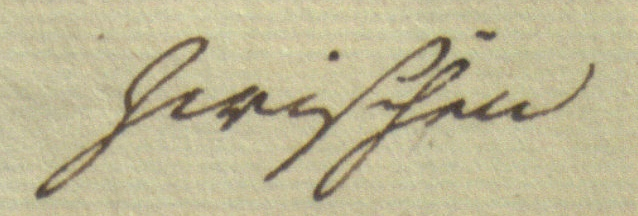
zwischen
